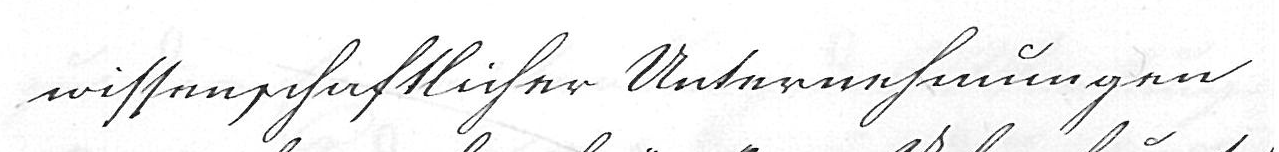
wissenschaftlichen Unternehnungen
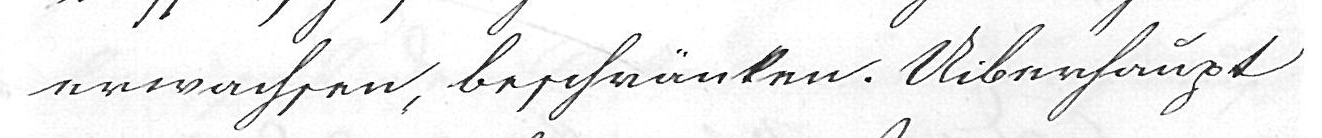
erwachsen, beschränken. Uibenhaupt
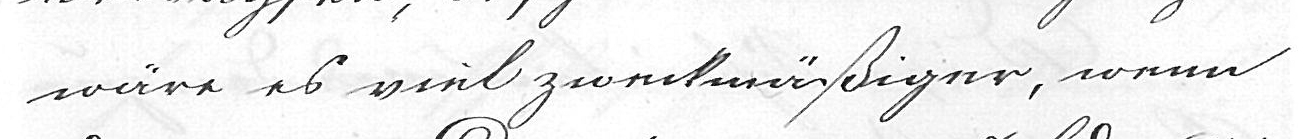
wäre es viel zweckmäßiger, wenn
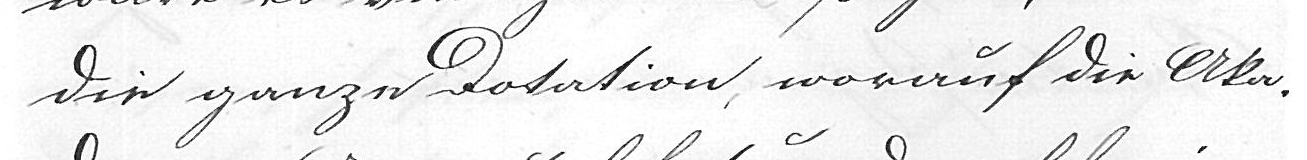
die ganze Dotation, worauf die Aka-
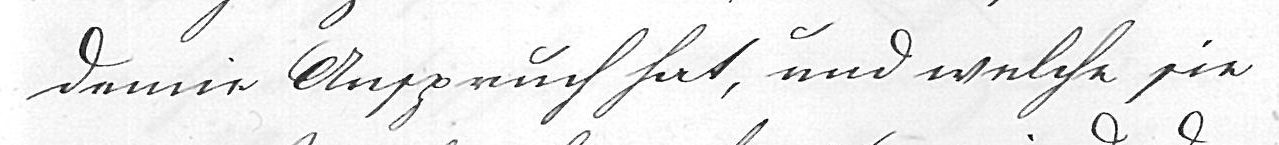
demie Anspruch hat, und welche sie
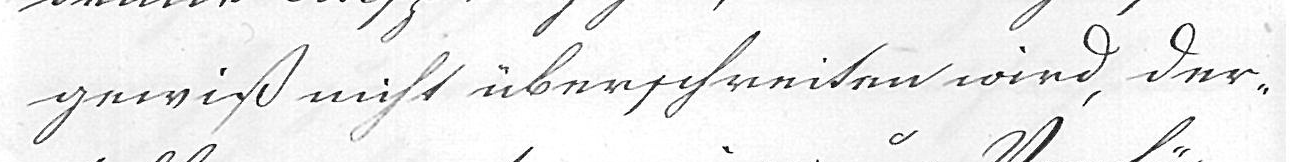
gewiß nicht überschreiten wird, der-
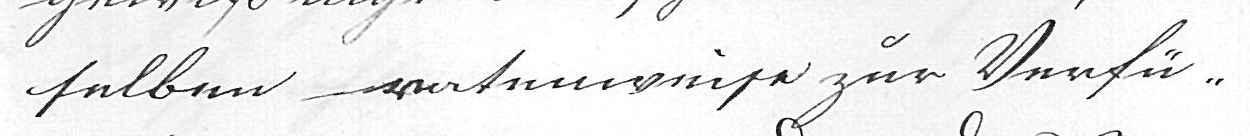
selben ratenweise zur Verfü-
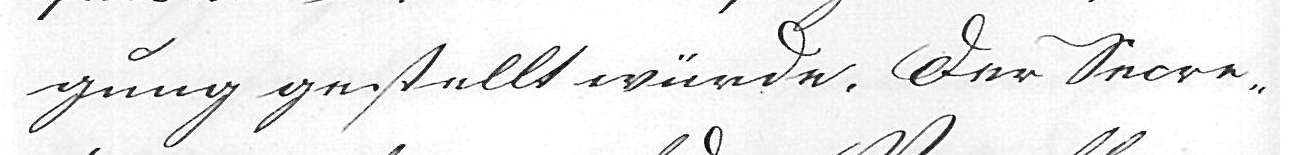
gung gestellt würde. Der Secre-
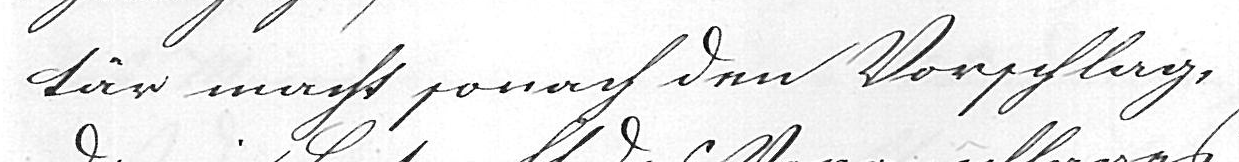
tär macht sonach den Vorschlag,
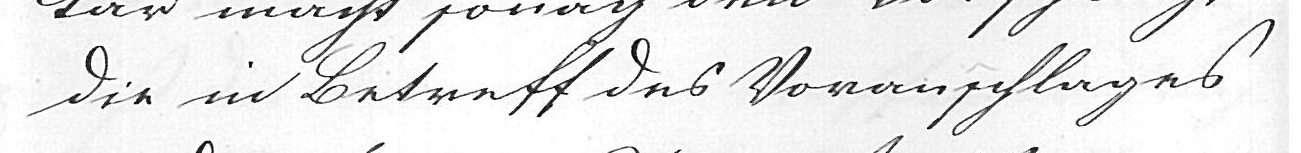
die in Betreff des Voranschlages
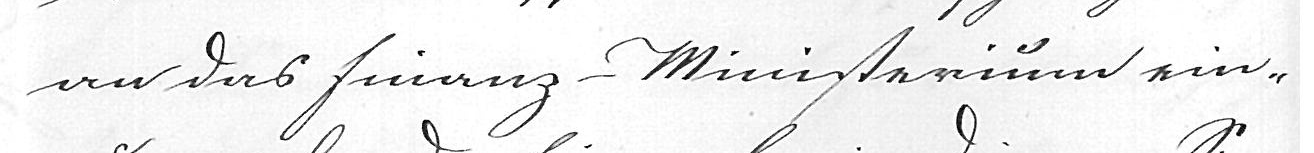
an das Finanz-Ministerium ein-
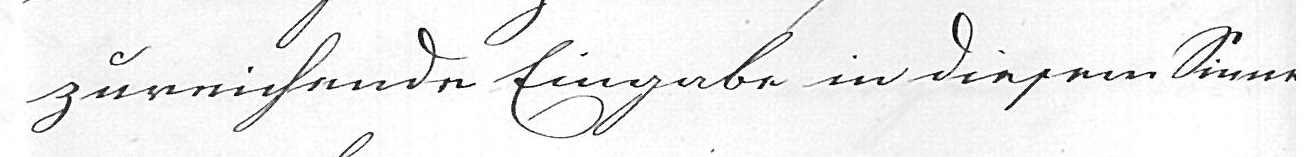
zureichende Eingabe in diesem Sinne
